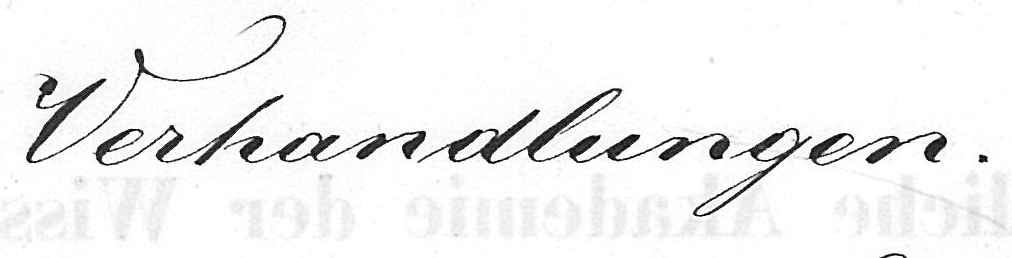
Verhandlungen.
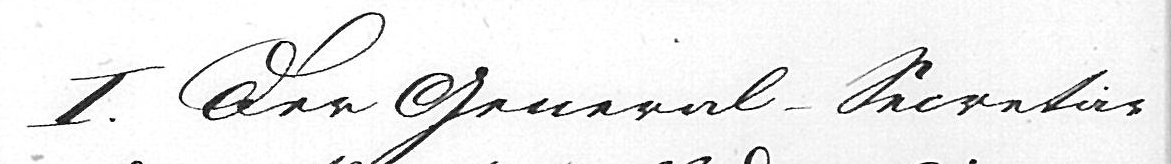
I. Der General-Secretär
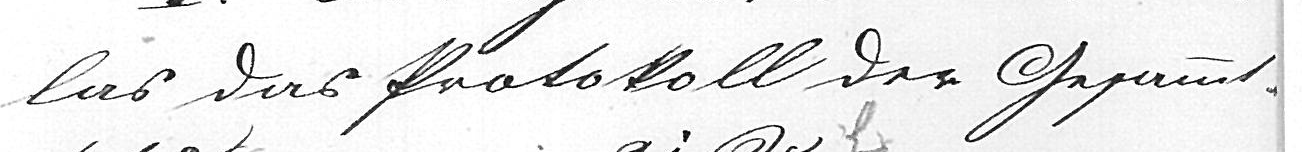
las das Protokoll der Gesammt-
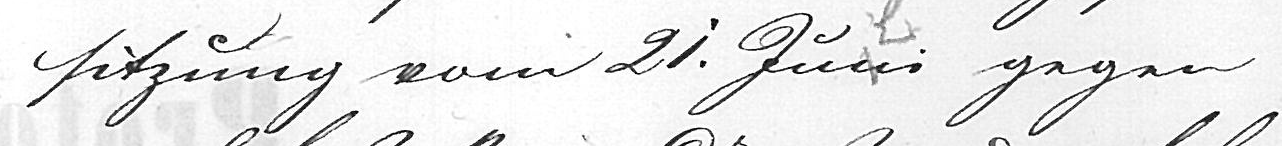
sitzung vom 21. Juli gegen
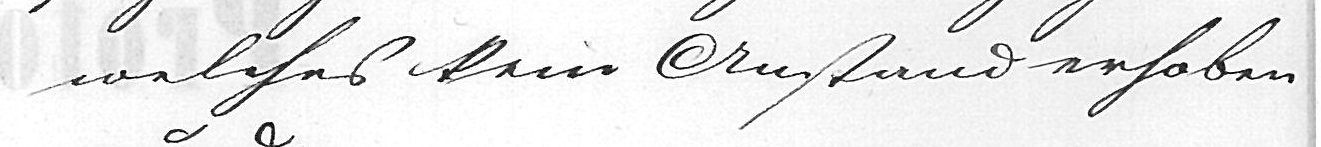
welches keine Anstand erhoben
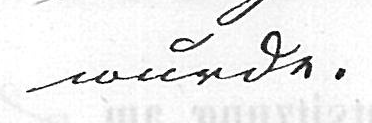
wurde.
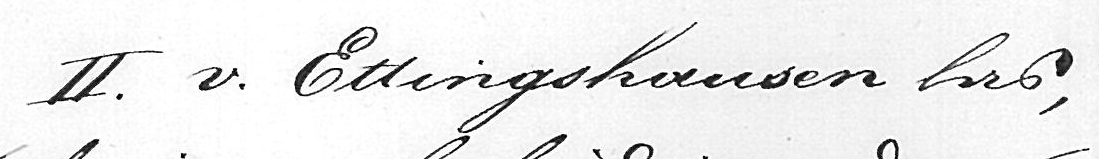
II. v. Ettingshausen las,
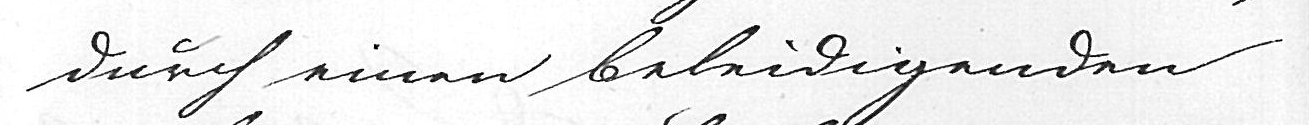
durch einen beleidigenden
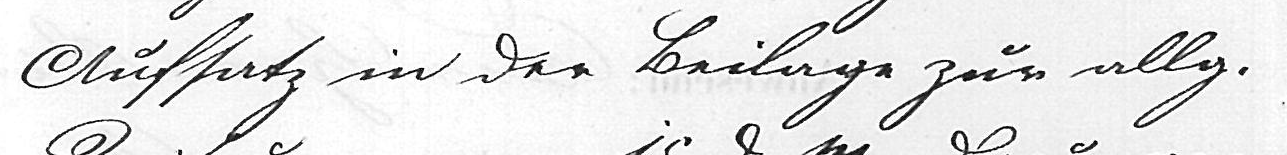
Aufsatz in der Beilage zur allg.
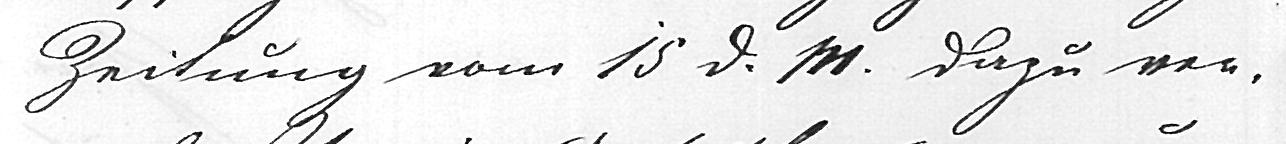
Zeitung vom 15 d. M. dazu ver-
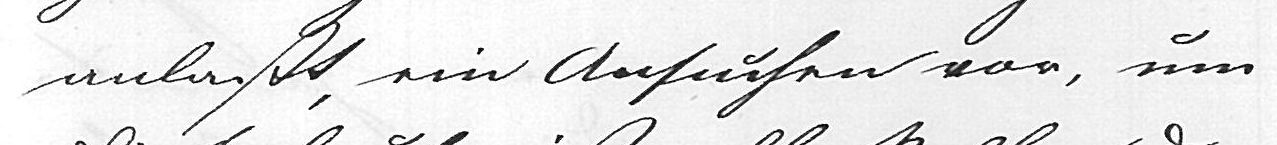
anlasht ein Ansuchen vor, um
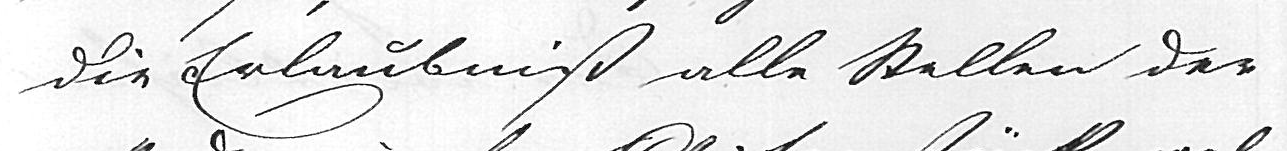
die Erlaubniß alle Stellen der
